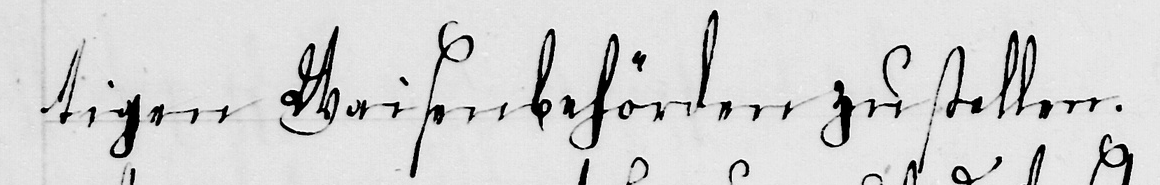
tigen Waisenbehörden zu stellen.
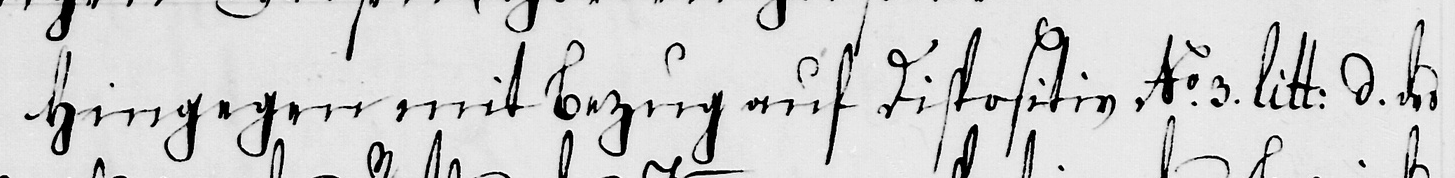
Hingegen mit Bezug auf Dispositiv N°. 3. litt: d.
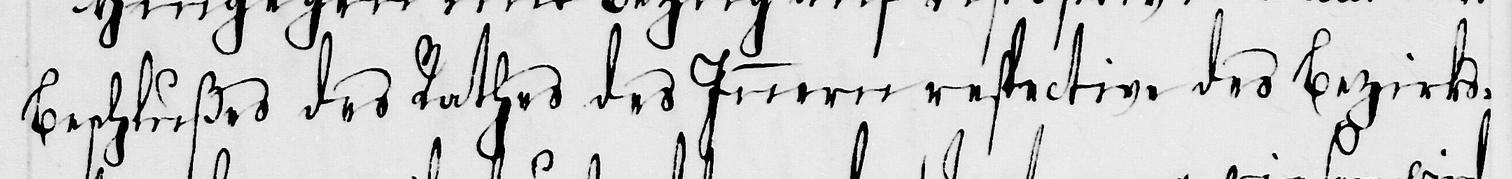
Beschlußes des Rathes des Innern respective des Bezirks¬
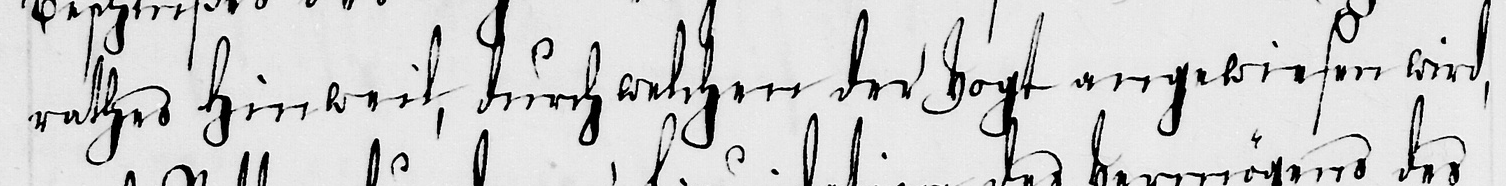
rathes Hinweil, durch welchen der Vogt angewiesen wird,
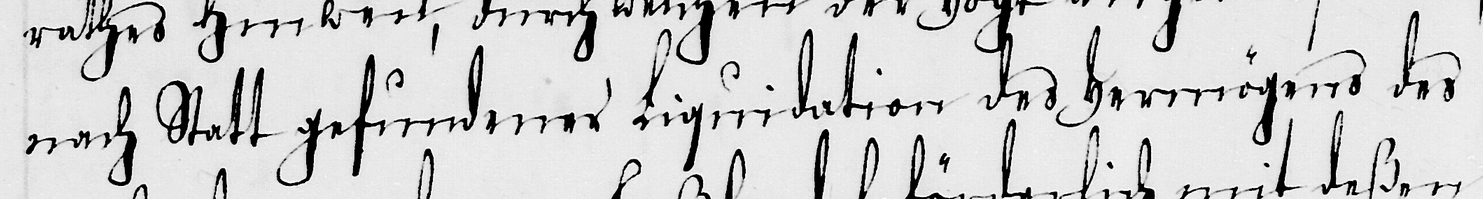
nach Statt gefundener Liquidation des Vermögens des
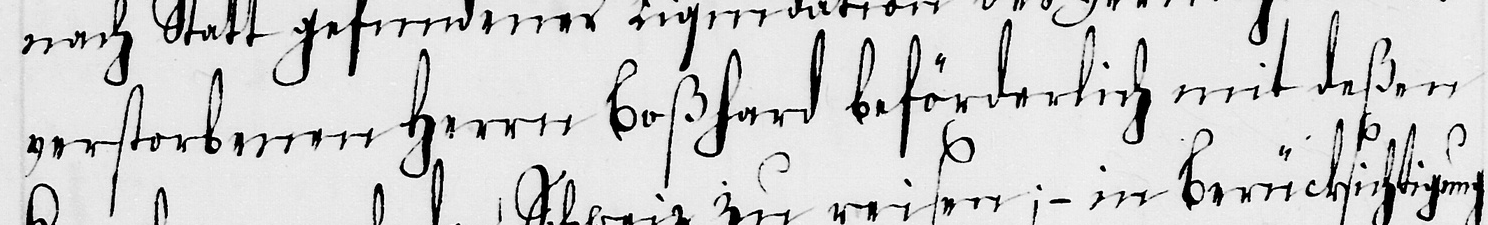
verstorbenen Herrn Boßhard beförderlich mit deßen
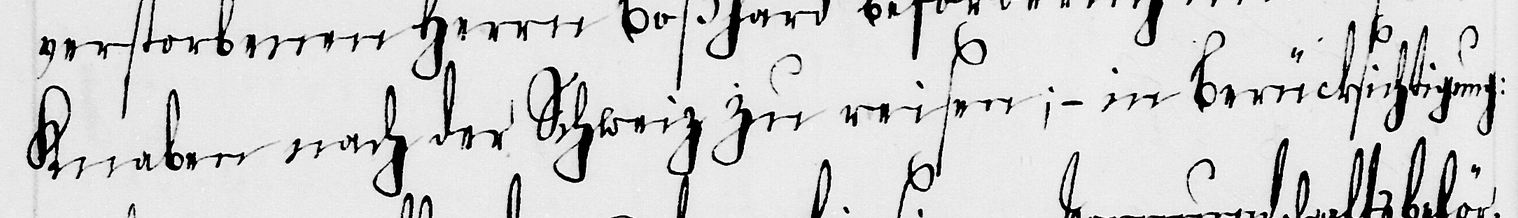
Knaben nach der Schweiz zu reisen; – in Berücksichtigung
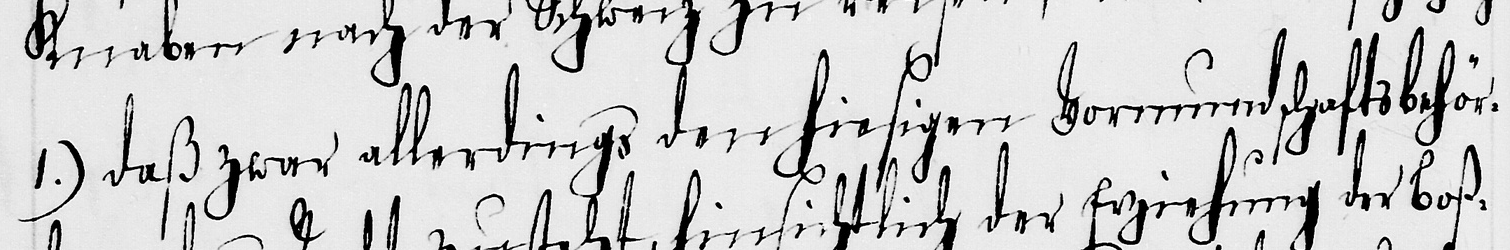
1.) daß zwar allerdings den hiesigen Vormundschaftsbehö¬
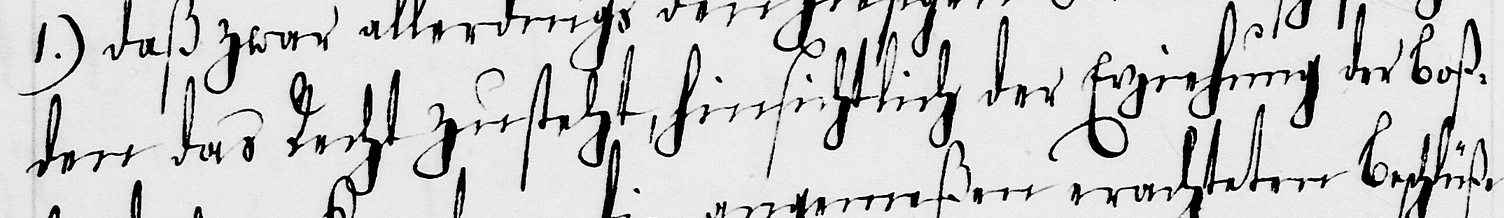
rden das Recht zusteht, hinsichtlich der Erziehung der Boß¬
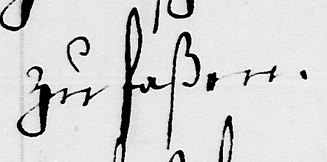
zu faßen.
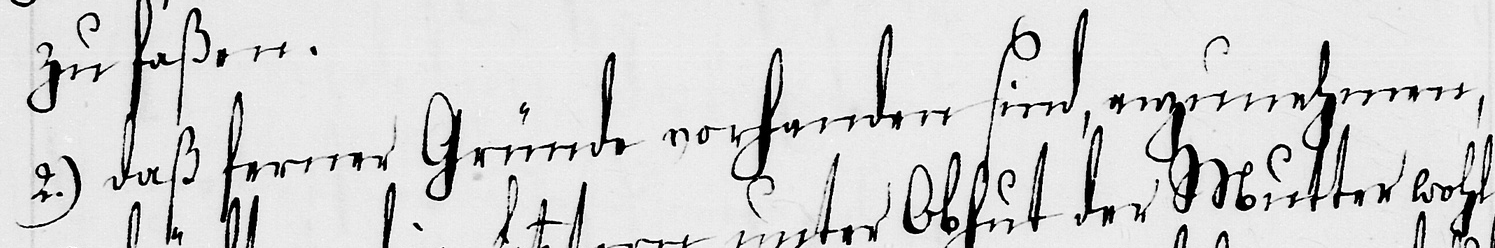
2.) daß ferner Gründe vorhanden sind, anzunehmen,
